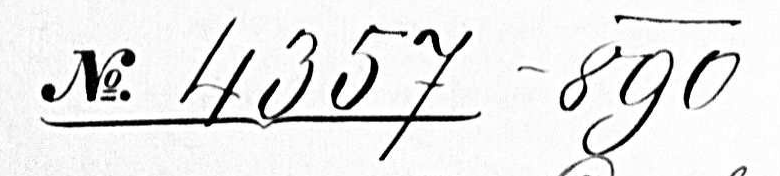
No. 4357 - 890
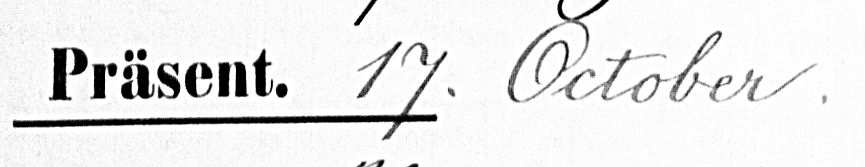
Präsent. 17. October.
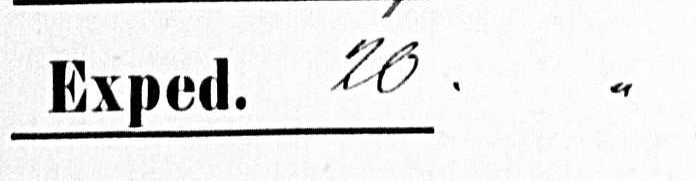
Exped. 20. October.
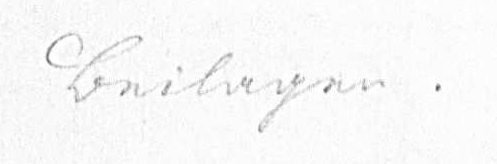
Beilagen.
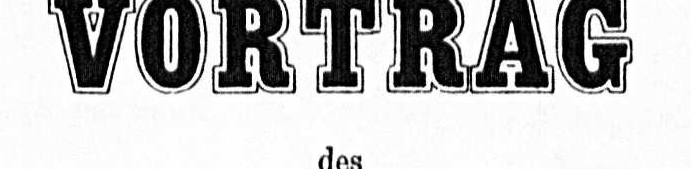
Vortrag
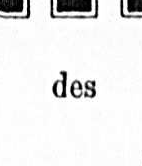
des
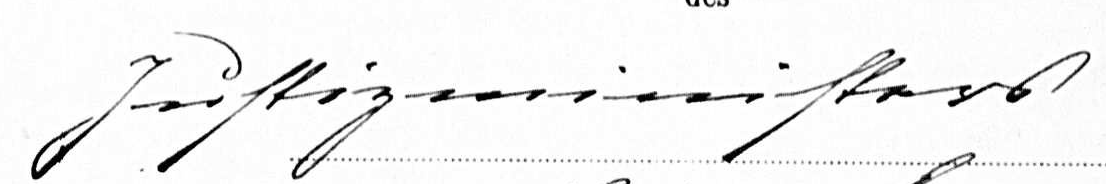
Justizministers
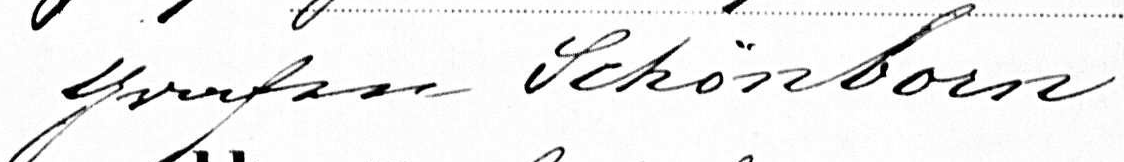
Grafen Schönborn
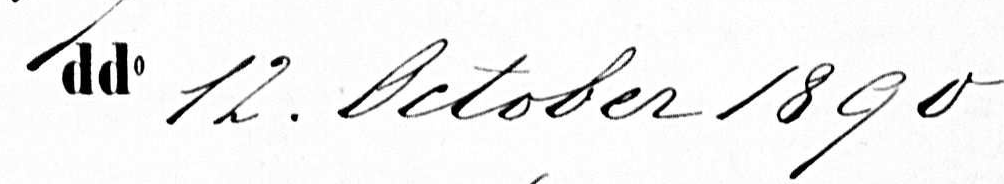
ddo 12. October 1890
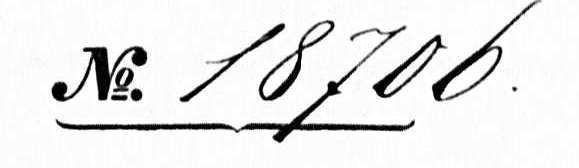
No. 18706.
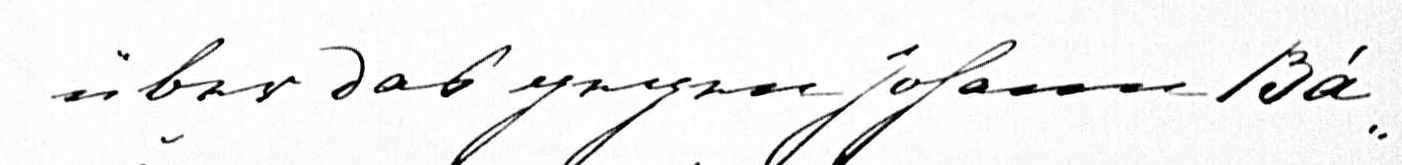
über das gegen Johann Bá¬
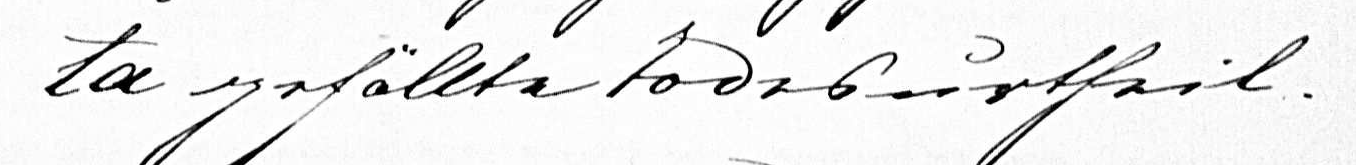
ta gefällte Todesurtheil.
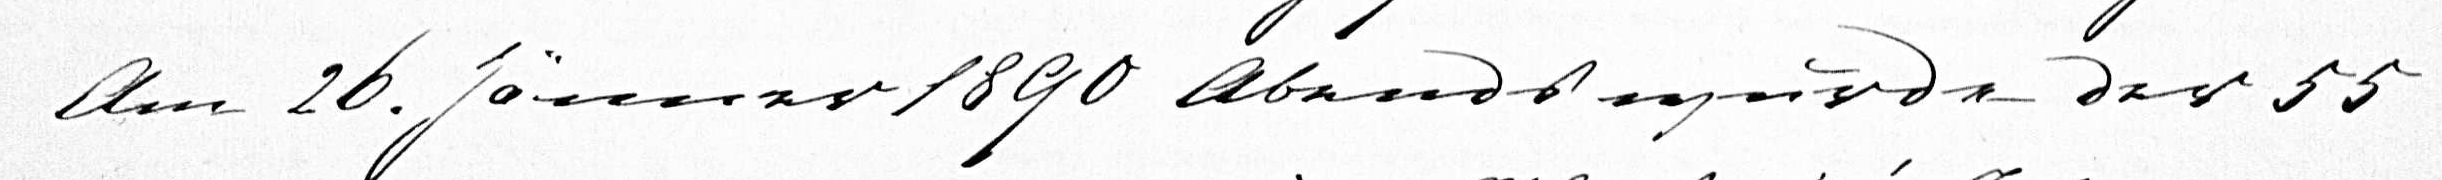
Am 26. Jänner 1890 Abends wurde der 55
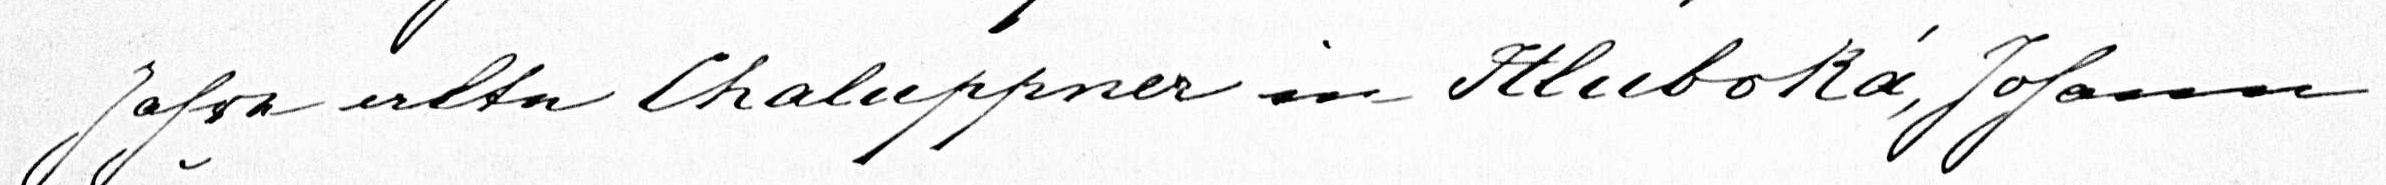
Jahre alte Chaluppner in Hluboká, Johann
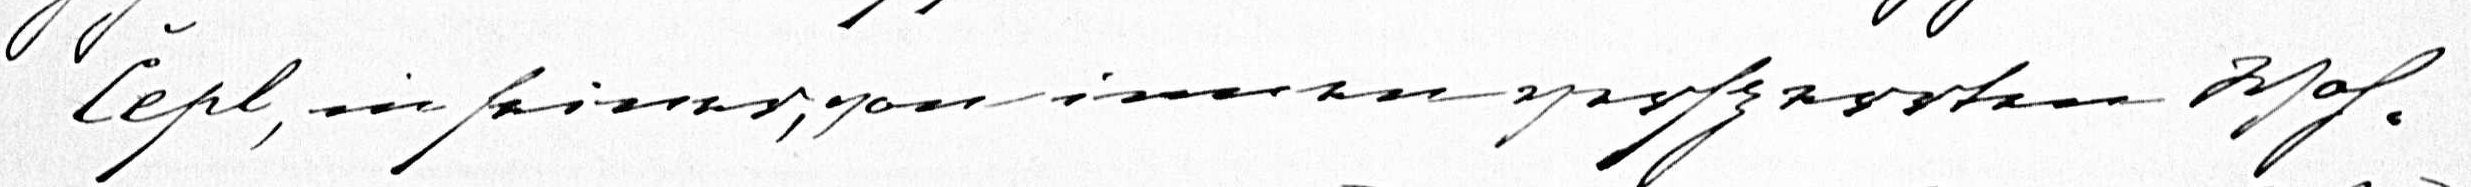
Čepl, in seiner, von innen versperrten Woh¬
